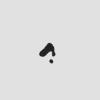居
